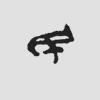民
